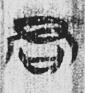君
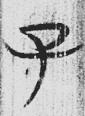子
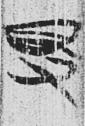○（得）
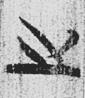之
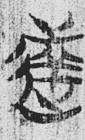○（失）
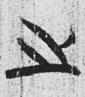之
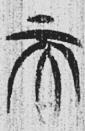天
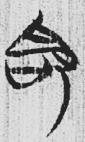命
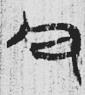今
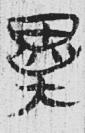異
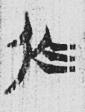於
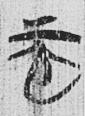而（尓）
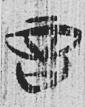言
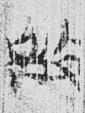○（曹）
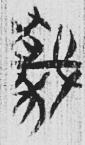○（沫）
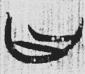曰
